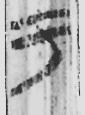于
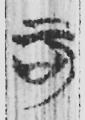可
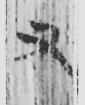又
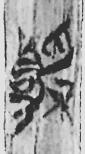靜
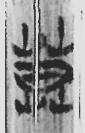莫
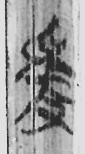爯
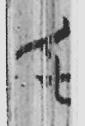氒
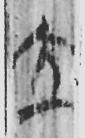立
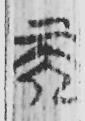而
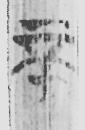不
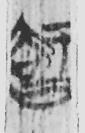智
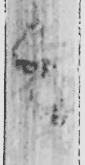允
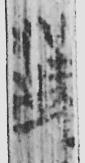{水呈皿}
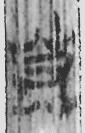莫
